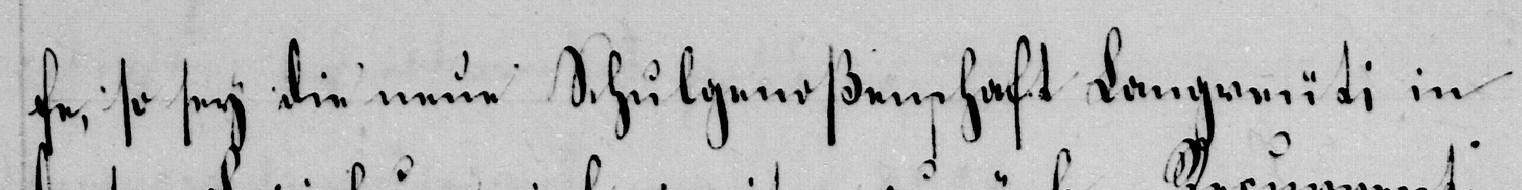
fe, so sey die neue Schulgenoßenschaft Langerüti in
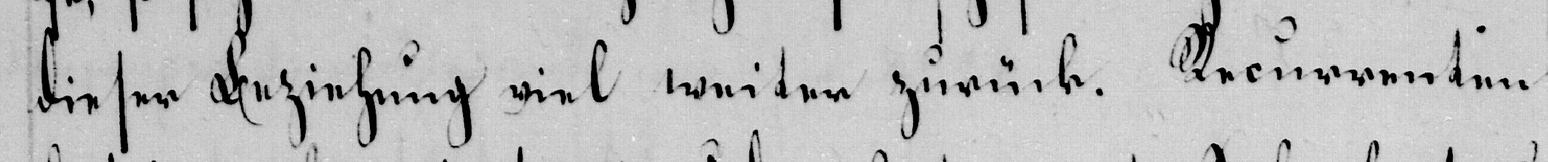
dieser Beziehung viel weiter zurück. Recurrenten
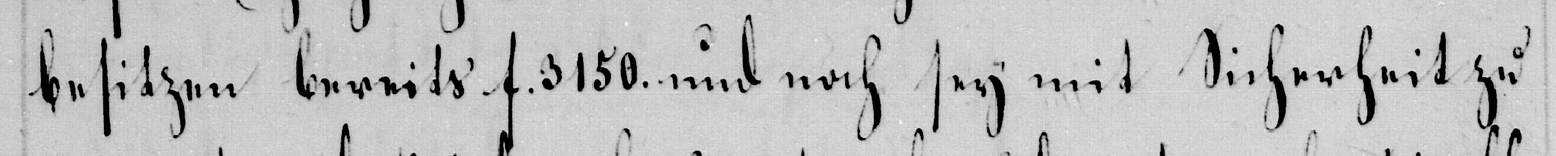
besitzen bereits f. 3150. und noch sey mit Sicherheit zu
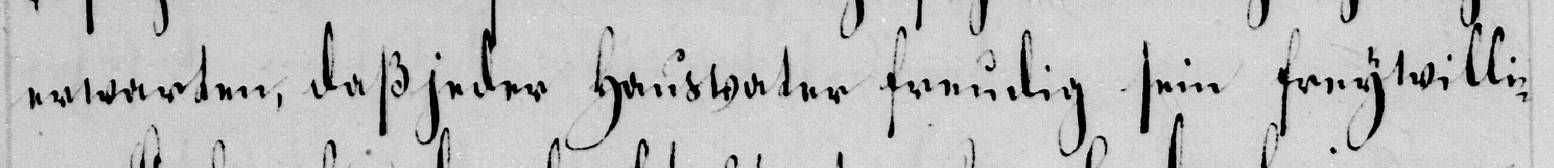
erwarten, daß jeder Hausvater freudig sein freywilli¬
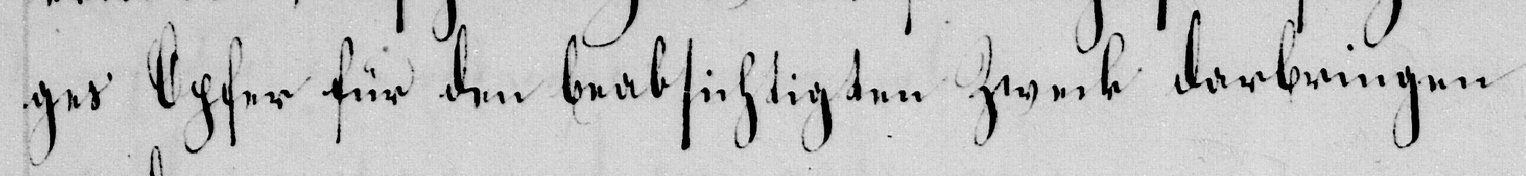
ges Opfer für den beabsichtigten Zweck darbringen
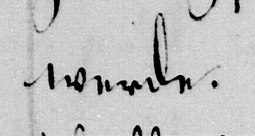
werde.
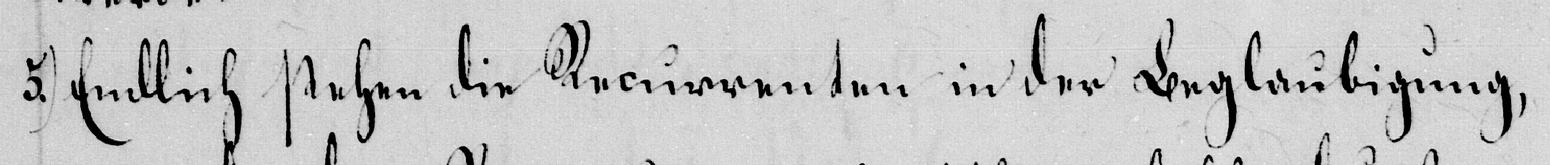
5.) Endlich stehen die Recurrenten in der Beglaubigung,
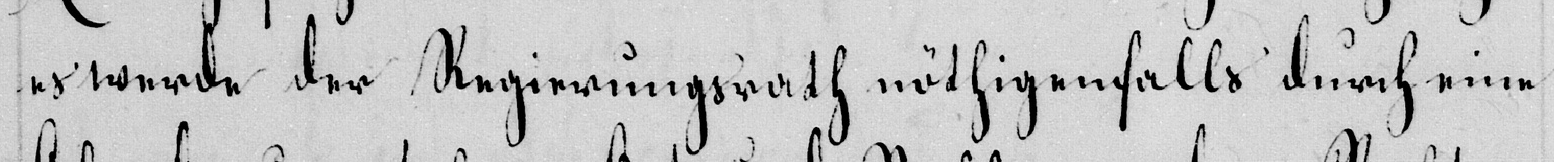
es werde der Regierungsrath nöthigenfalls durch eine
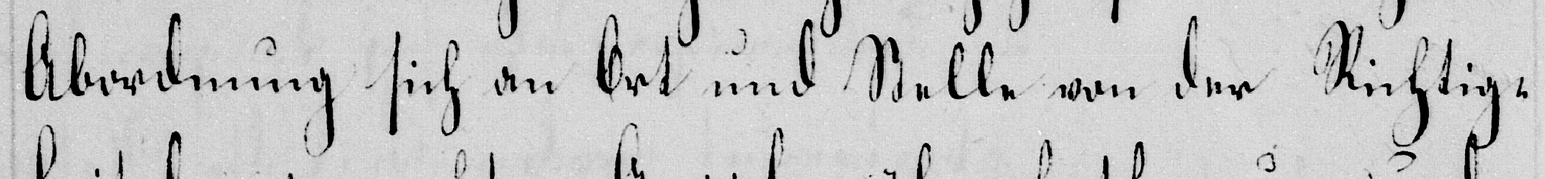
Abordnung sich an Ort und Stelle von der Richtig¬
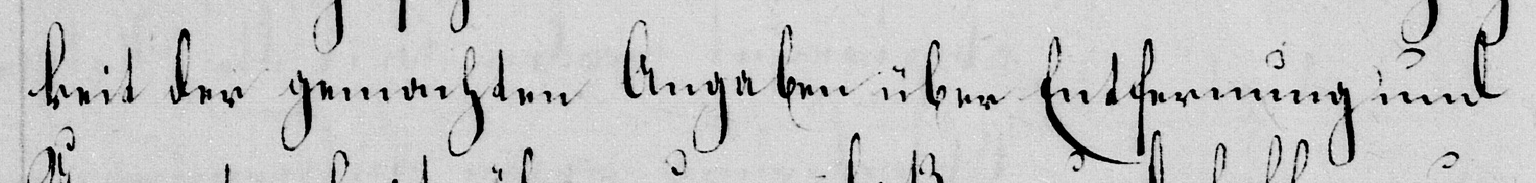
keit der gemachten Angaben über Entfernung und
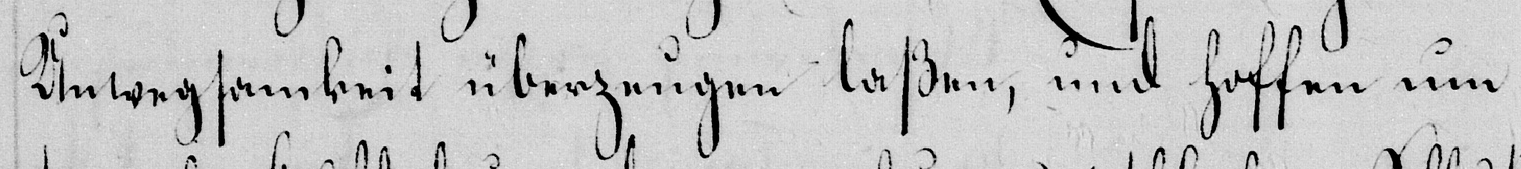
Unwegsamkeit überzeugen laßen, und hoffen um
